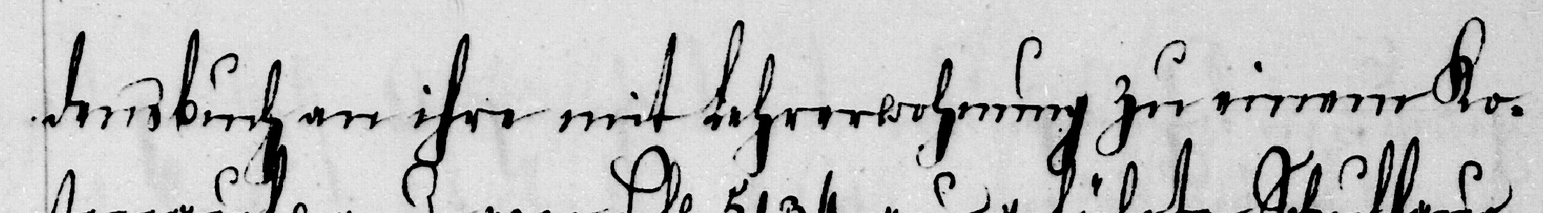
densbuch an ihre mit Lehrerwohnung zu einem Ko¬
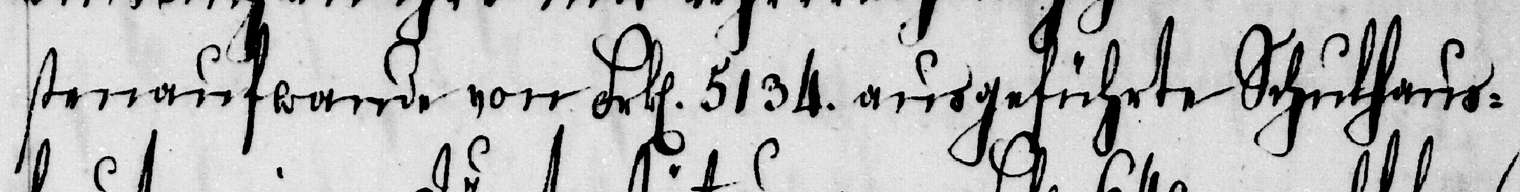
stenaufwande von Frk[en]. 5134. ausgeführte Schulhaus¬
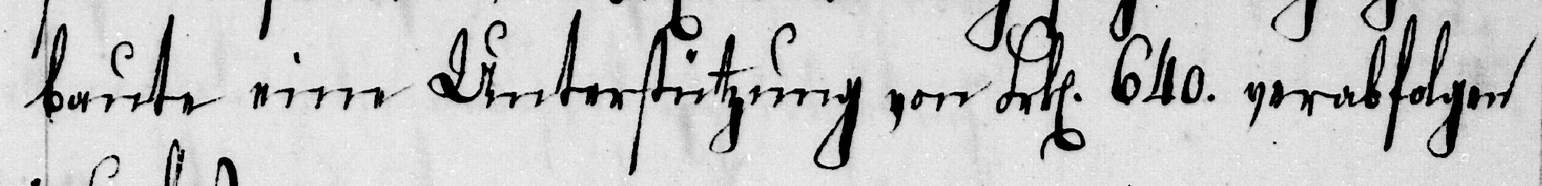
baute eine Unterstützung von Frk[en]. 640. verabfolgen
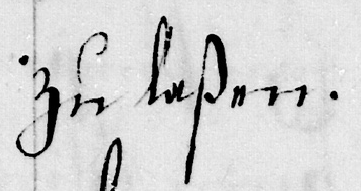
zu laßen.
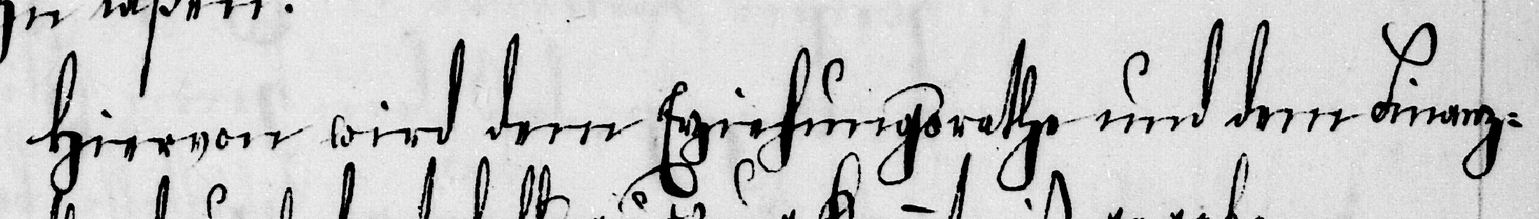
Hiervon wird dem Erziehungsrathe und dem Finanz¬
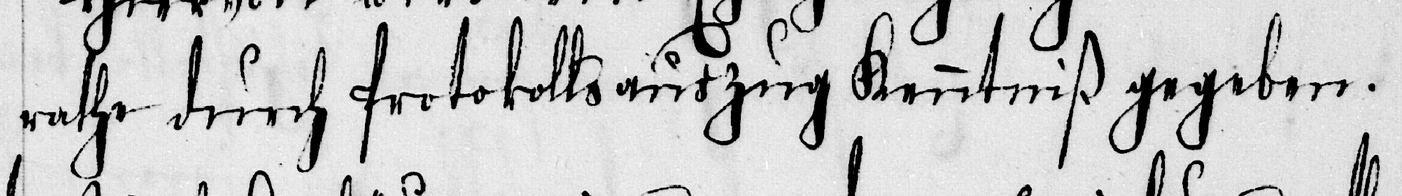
rathe durch Protokollsauszug Kenntniß gegeben.
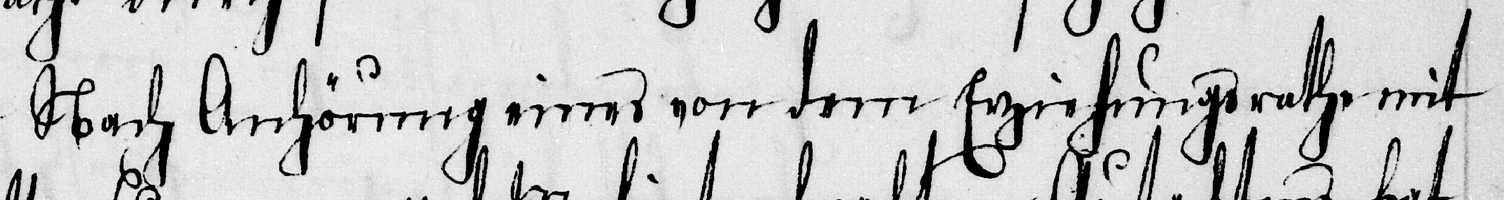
Nach Anhörung eines von dem Erziehungsrathe mit
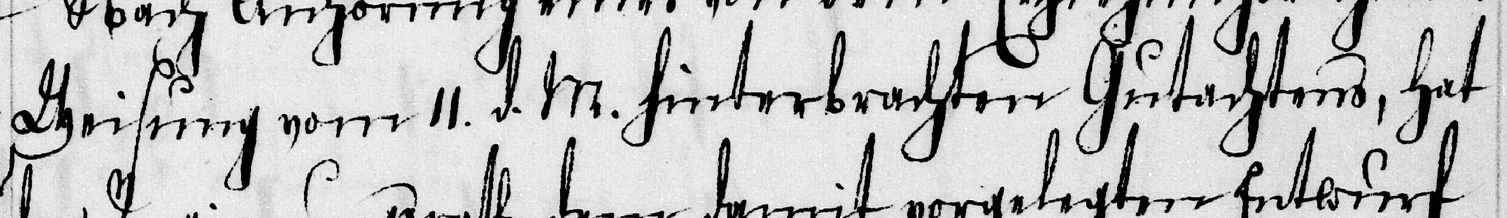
Weisung vom 11. d. M. hinterbrachten Gutachtens, hat
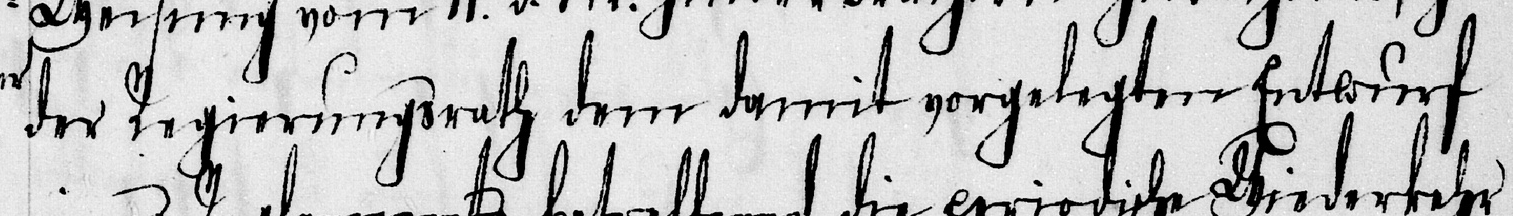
der Regierungsrath dem damit vorgelegten Entwurf
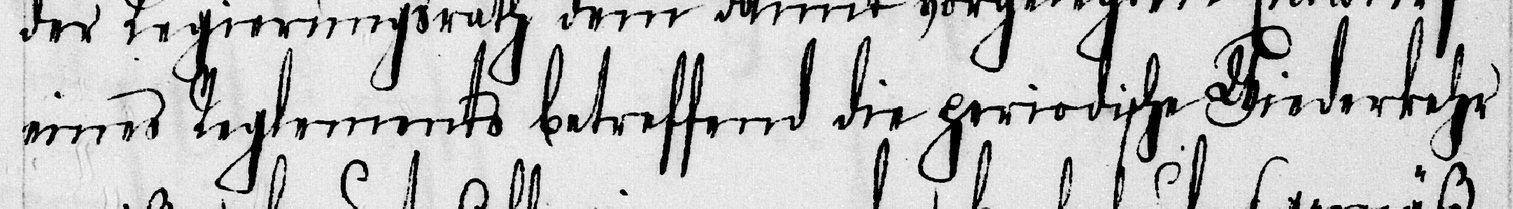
eines Reglements betreffend die periodische Wiederkehr
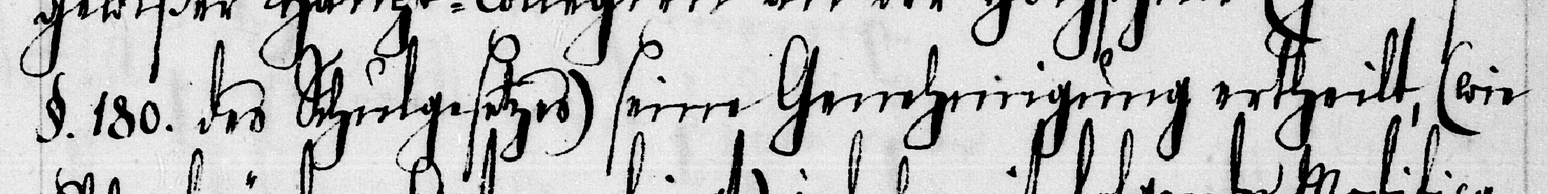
§. 180. des Schulgesetzes) seine Genehmigung ertheilt, (wie
